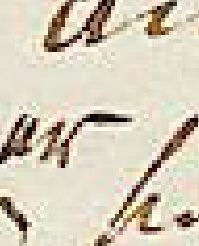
er
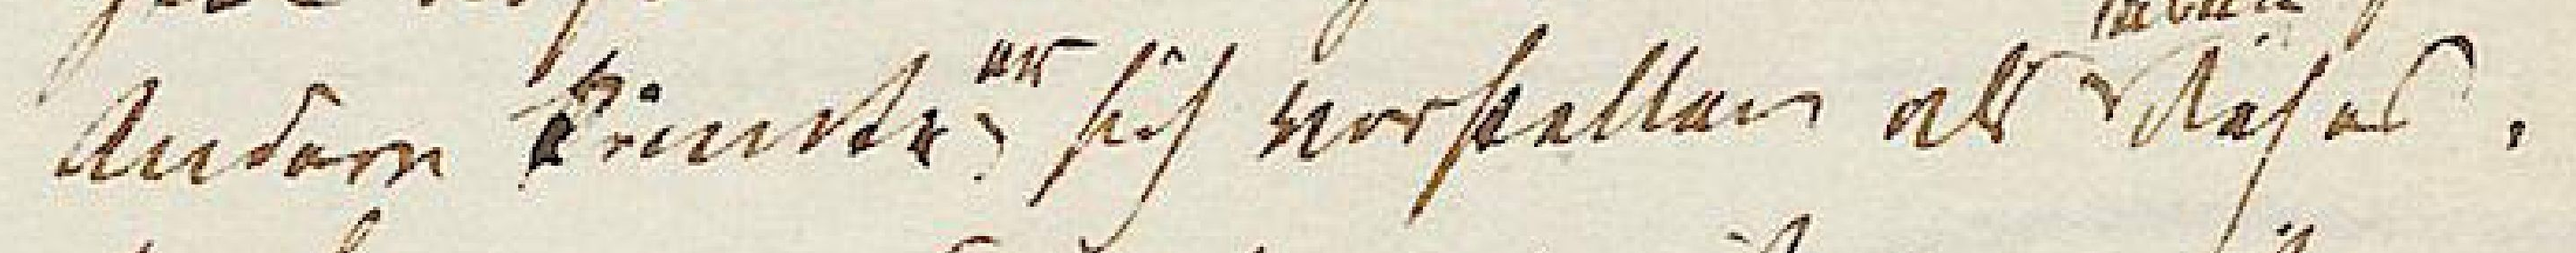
Andern könnte sich vorstellen als dieses.
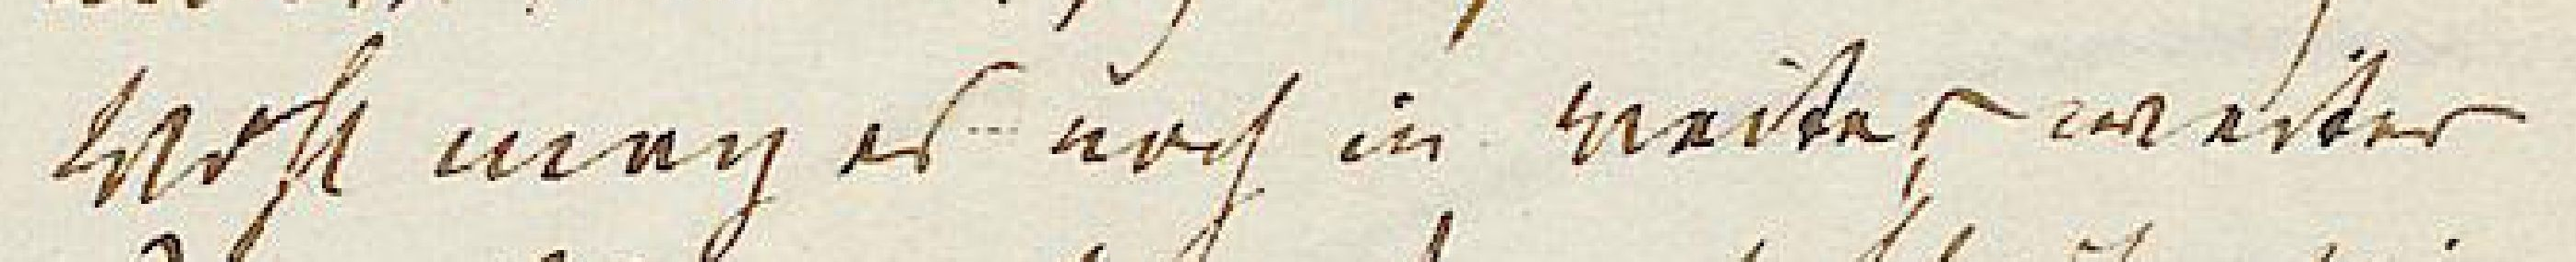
Wohl mag es noch in weiter weiter
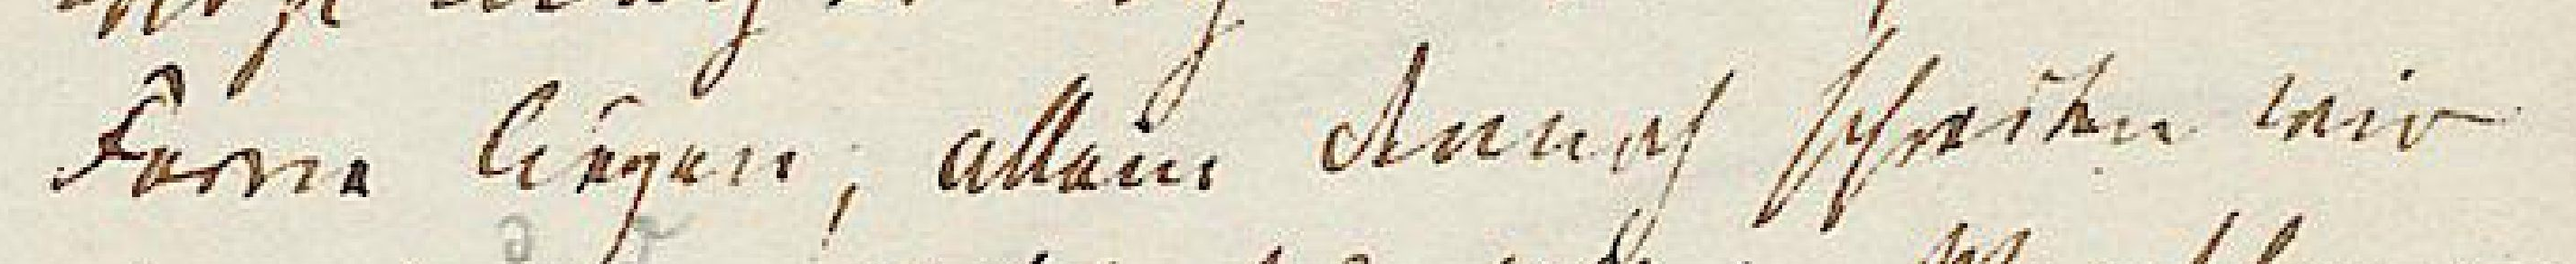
Ferne liegen, allein dennoch schreiben wir
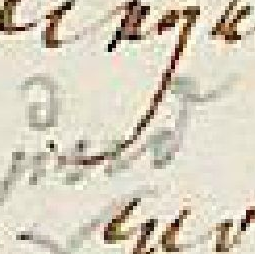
und
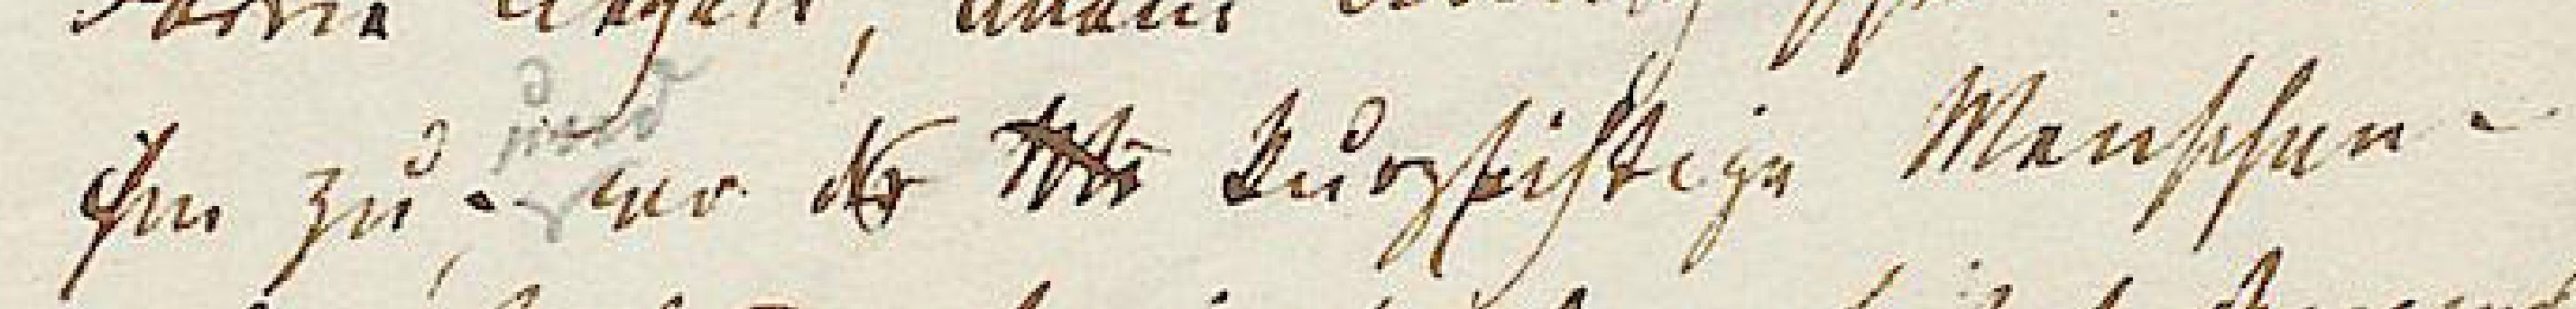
ihm zu wo ds Mn kurzfristige Menschen¬
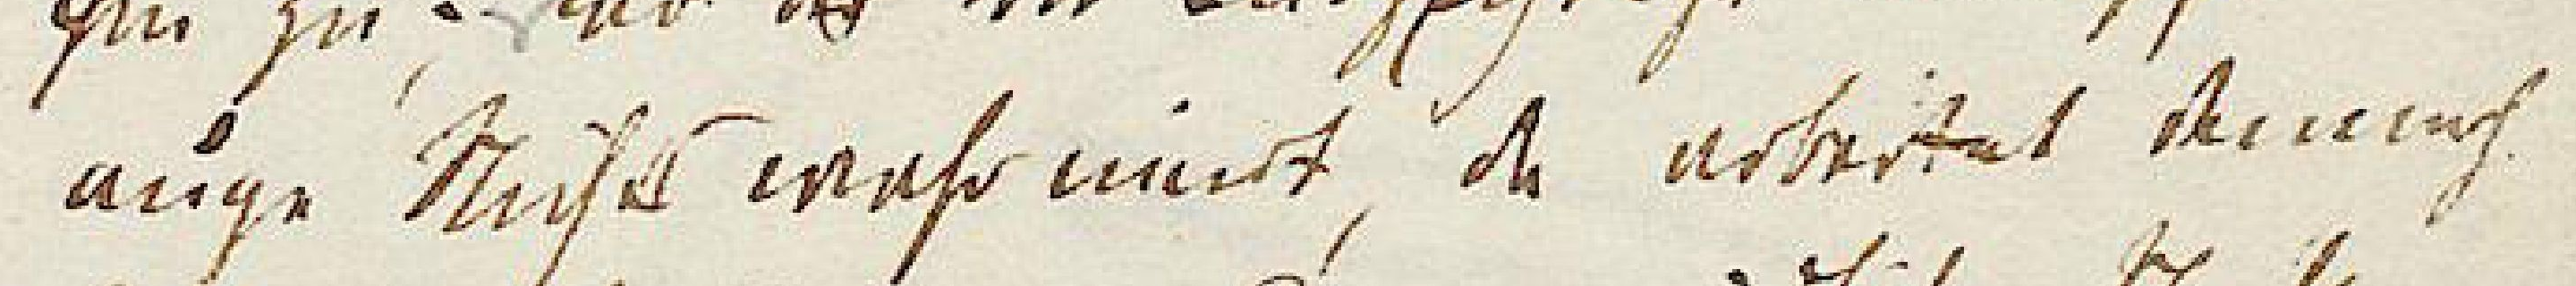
auge Nichts wahrnimmt, da verbreitet dennoch
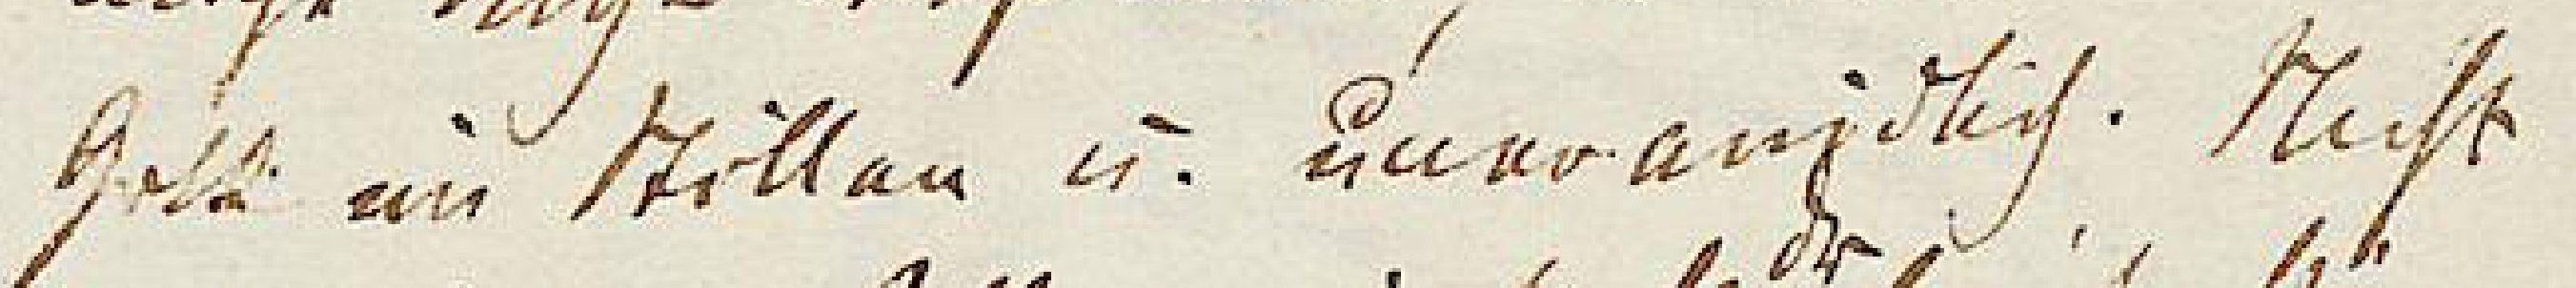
Gott im Stillen u. unermüdlich. Nicht
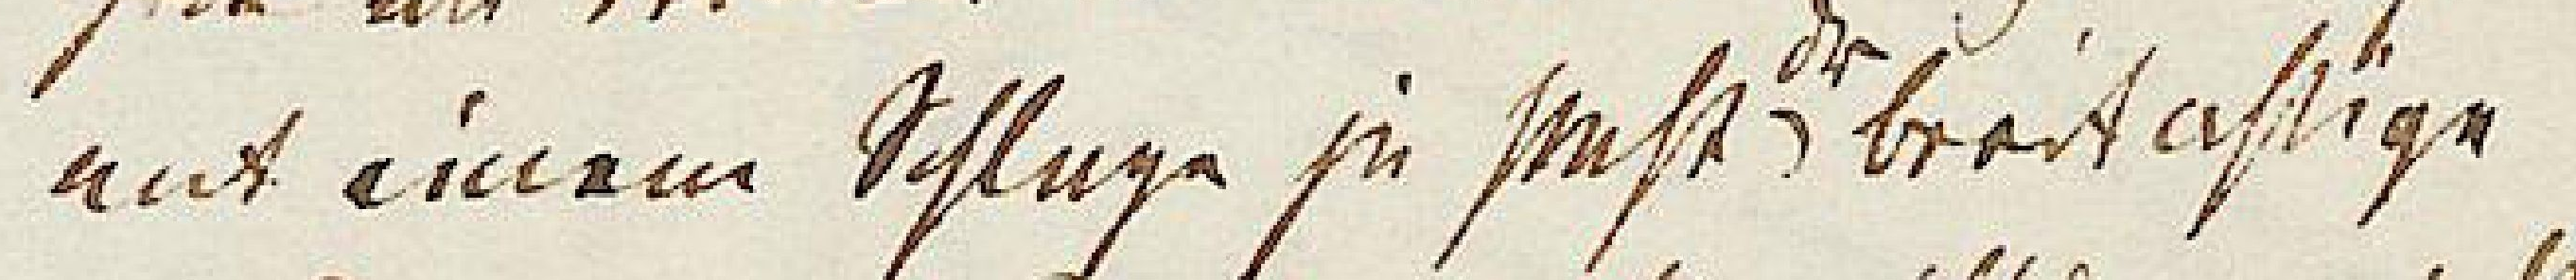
mit einem Schlage ja stehts breiastig
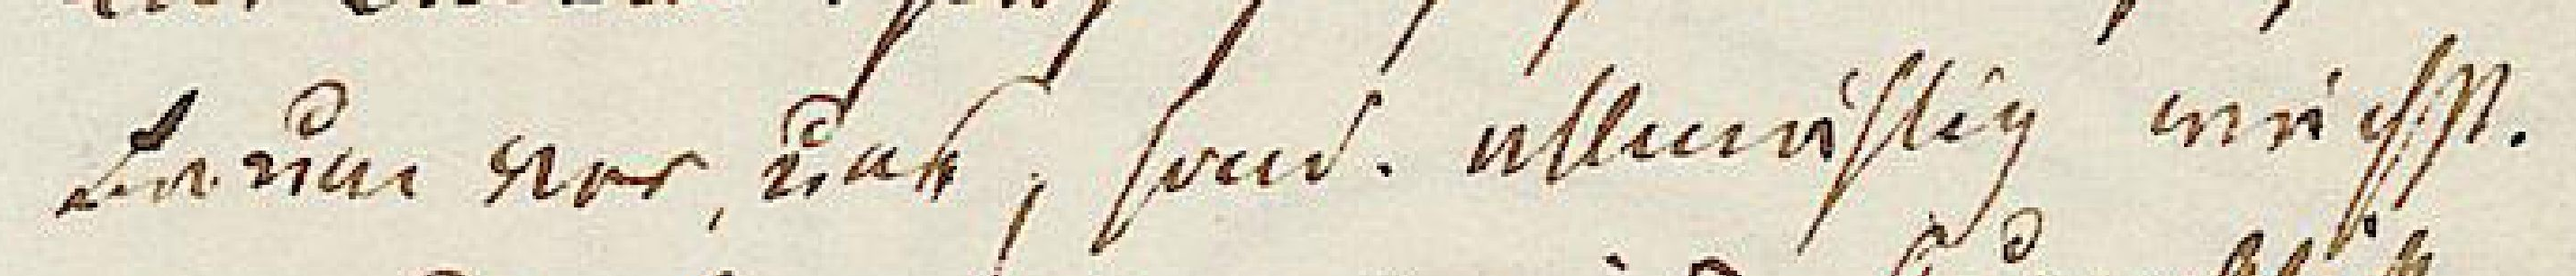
Baum voraus, sond. allmächtig wächst
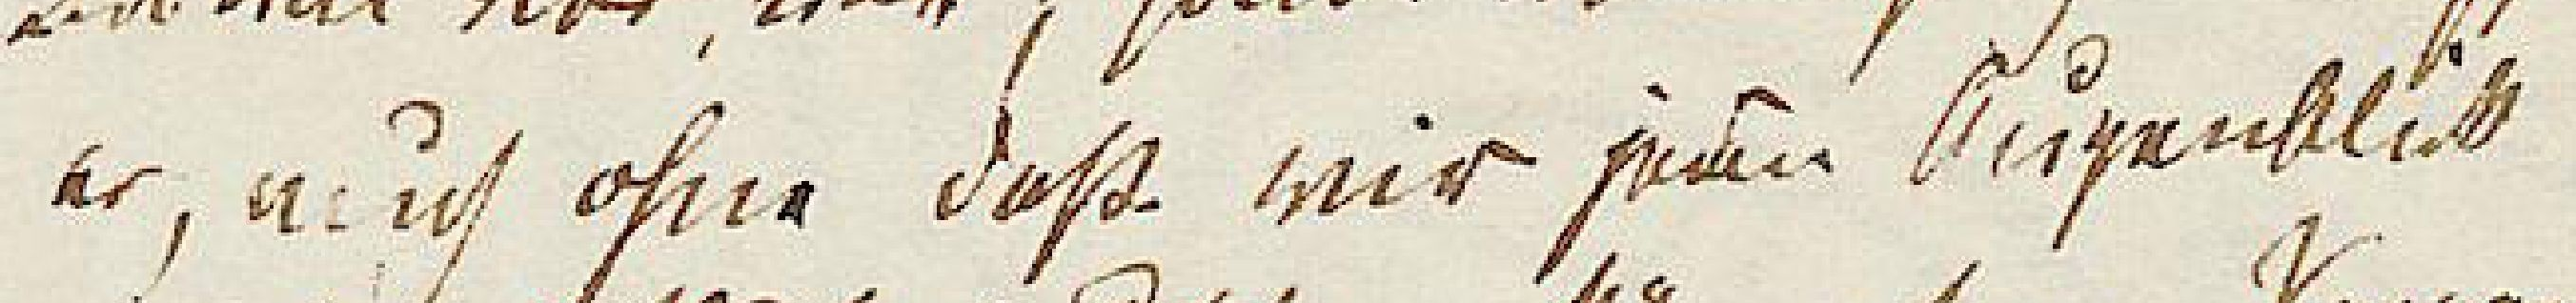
er, auch ohne daß wir jeden Augenblick
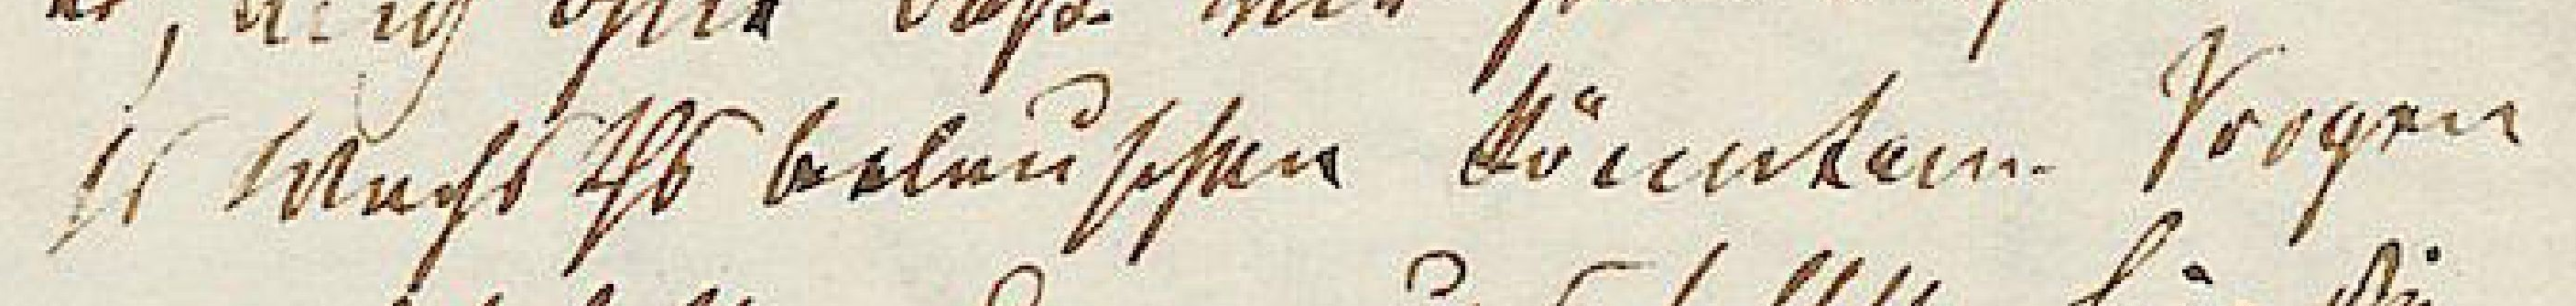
ss Wachsths haben sehen könnten. Sorgen
